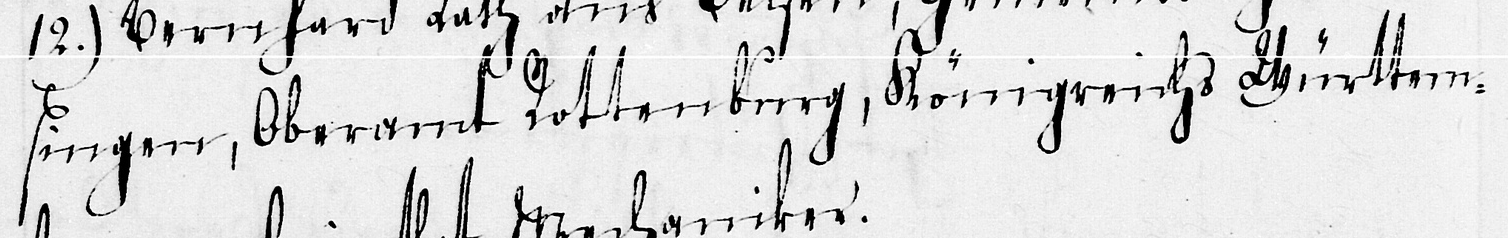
ingen, Oberamt Rottenburg, Königreichs Württem¬
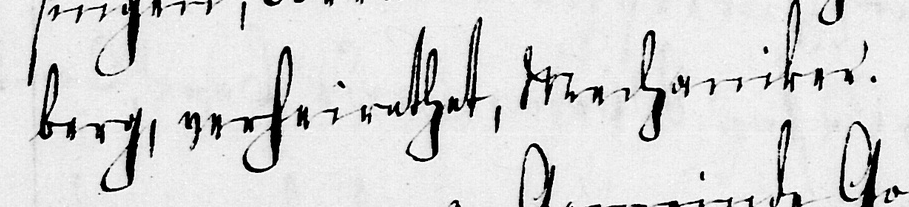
berg, verheirathet, Mechaniker.
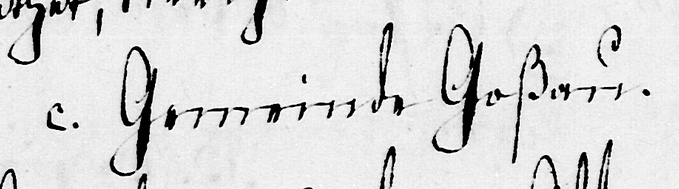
c. Gemeinde Goßau.
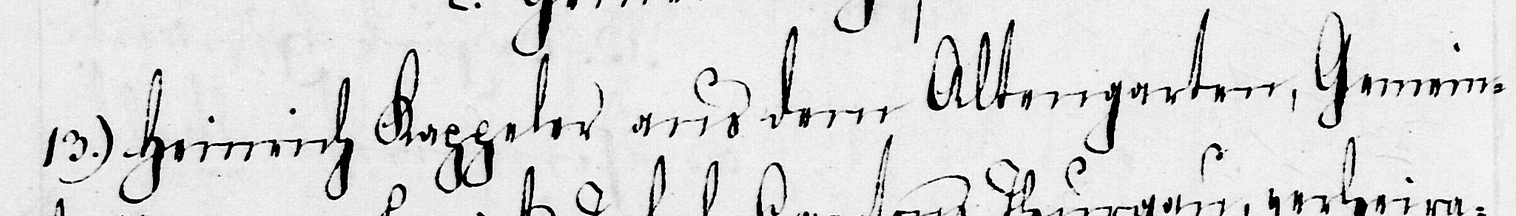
13.) Heinrich Kappeler aus dem Altengarten, Gemein¬
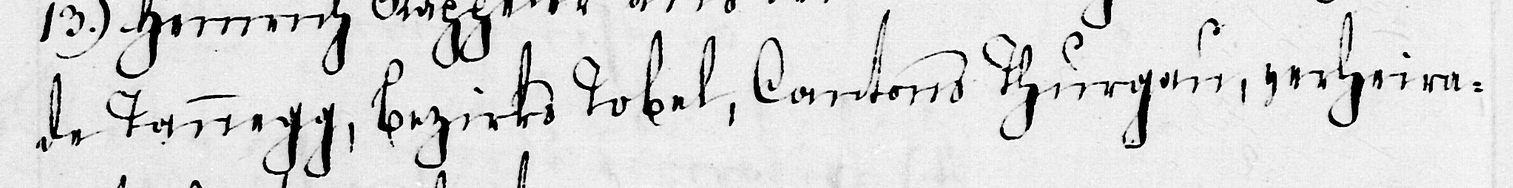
de Tannegg, Bezirks Tobel, Cantons Thurgau, verheira¬
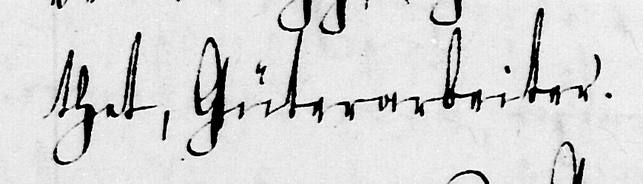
thet, Güterarbeiter.
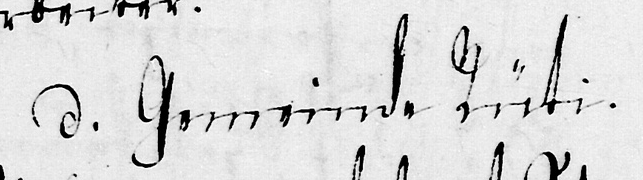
d. Gemeinde Rüti.
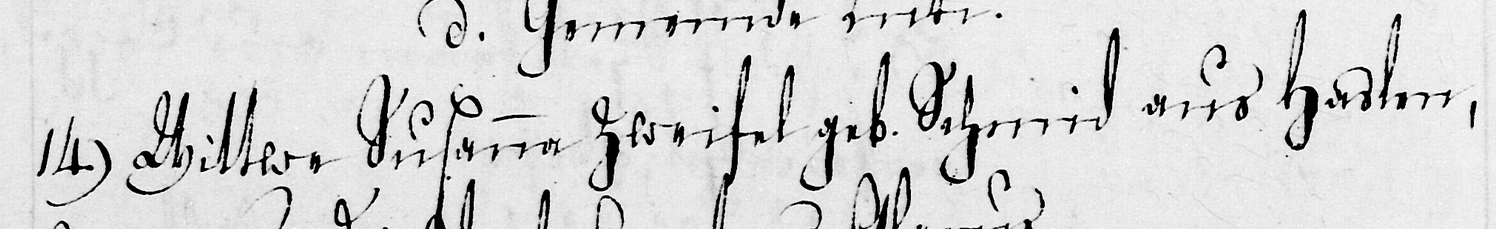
14.) Wittwe Susanna Zweifel geb. Schmid aus Haslen,
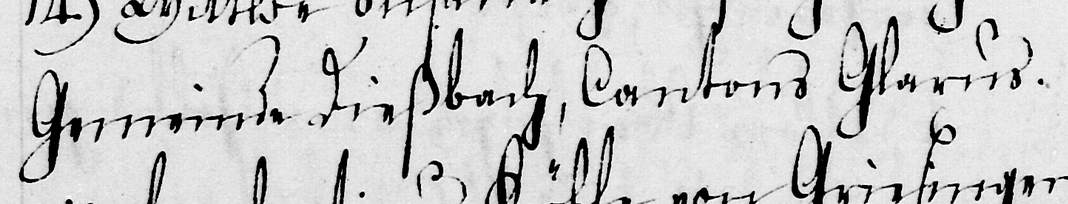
Gemeinde Dießbach, Cantons Glarus.
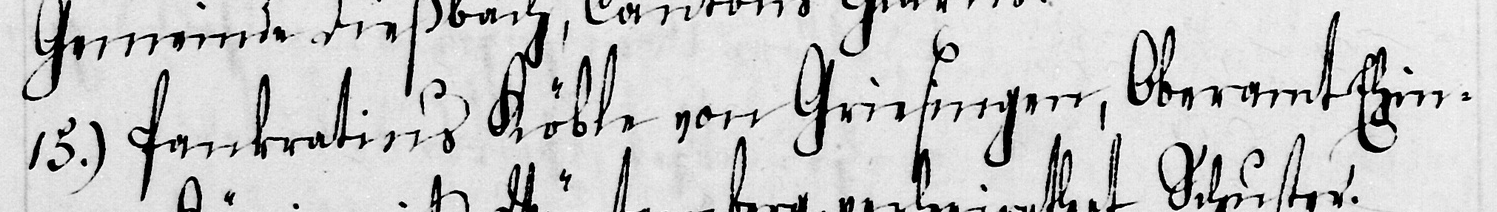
15.) Pankratius Köble von Griesingen, Oberamt Ehin¬
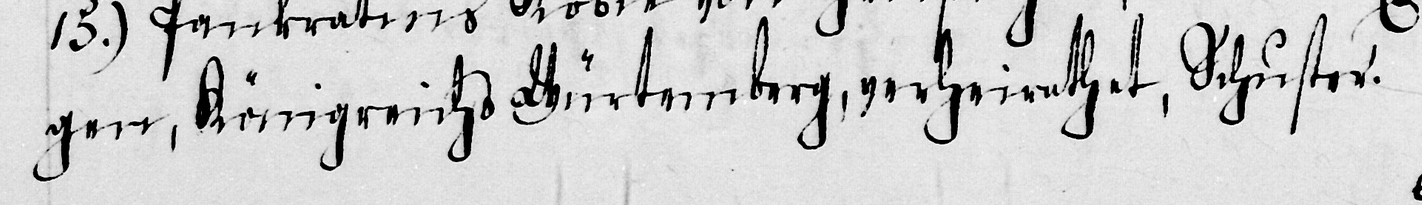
gen, Königreichs Würtemberg, verheirathet, Schuster.
